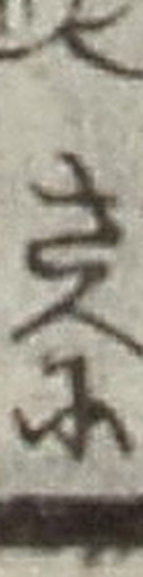さへに
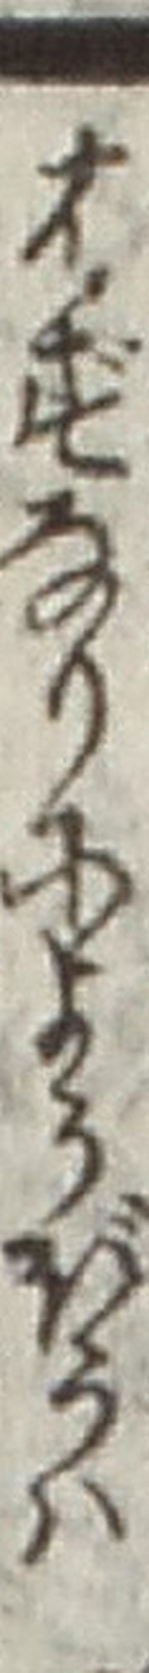はずなりにようぼうは
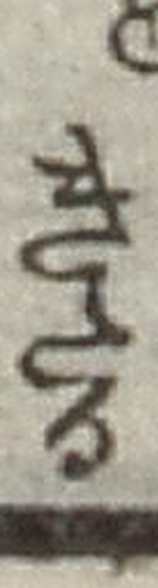きたる
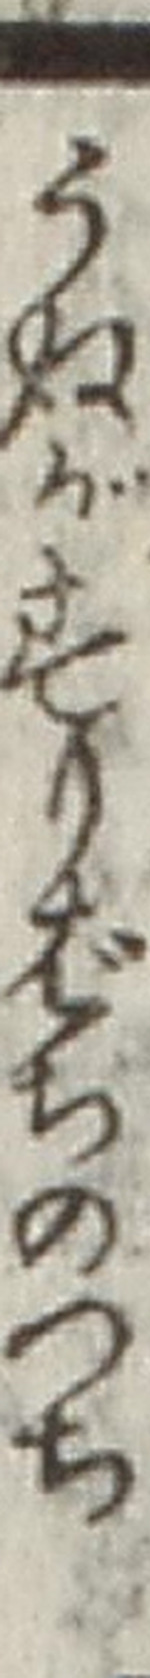うぬがすりばちのつち
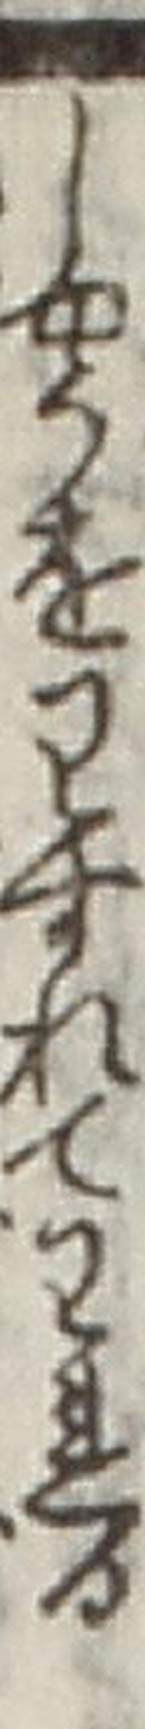しやうをわすれてわれる
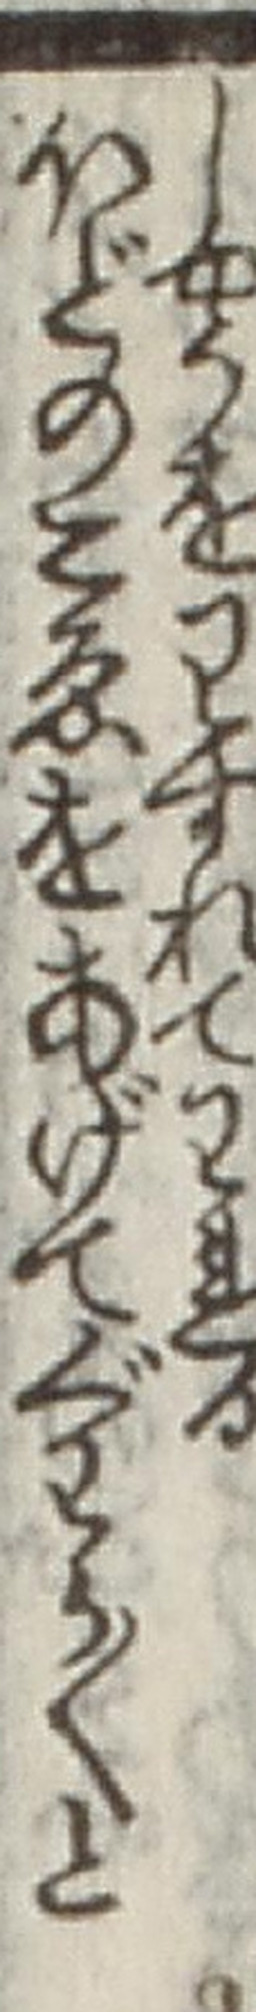ほどのこゑをあげてぐわう〳〵と
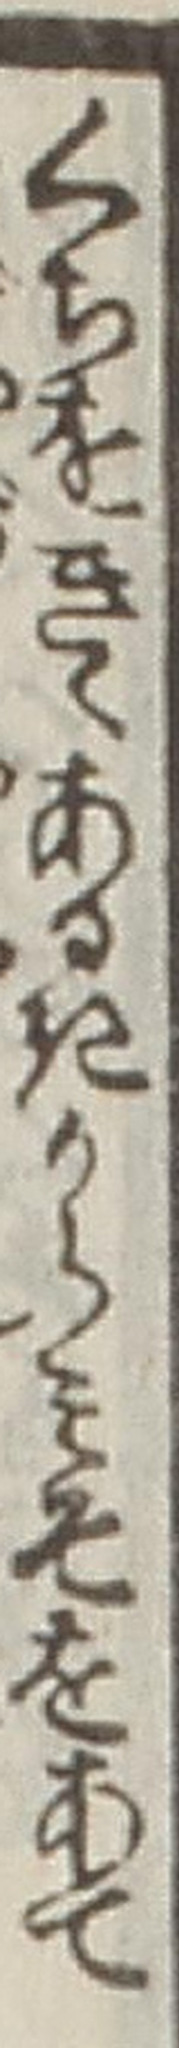くちをきゝあるきからみそをあて
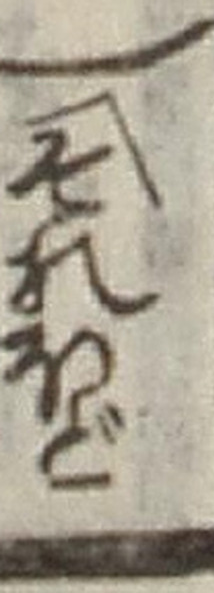〽それほど
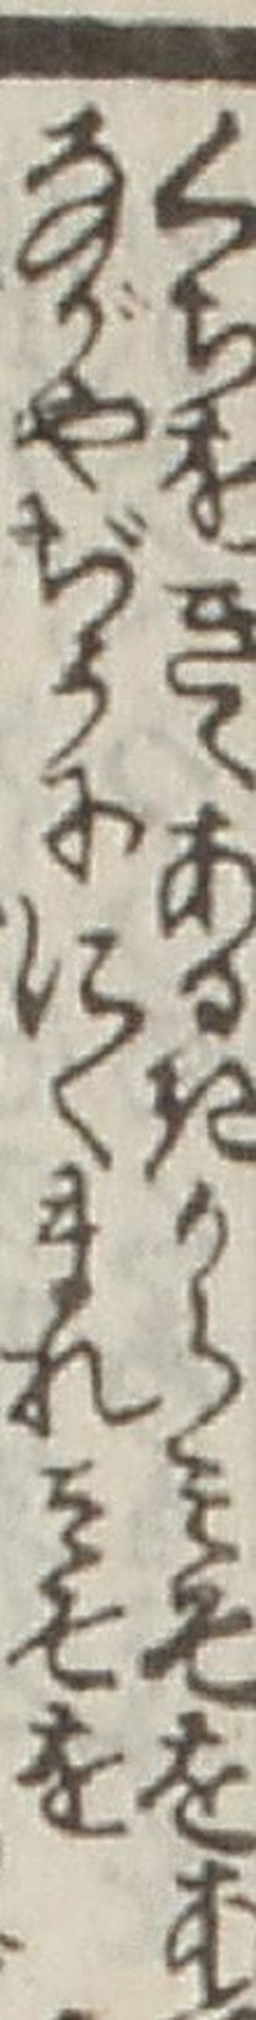ながやぢうににくまれみそを
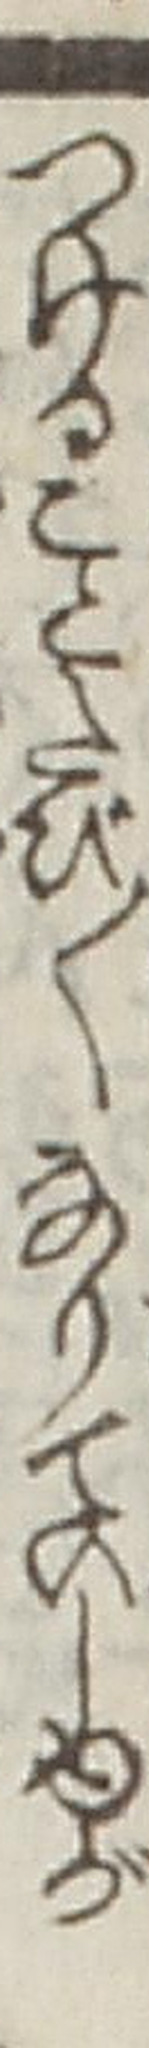つけることたび〳〵なりていしゆが
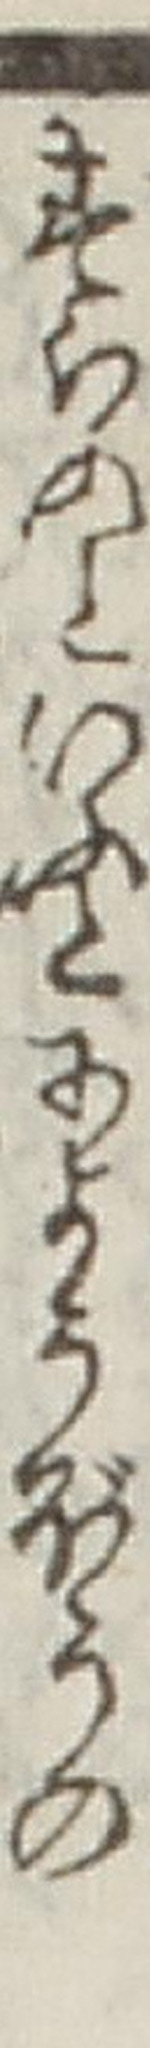すらのといふとにようぼうの
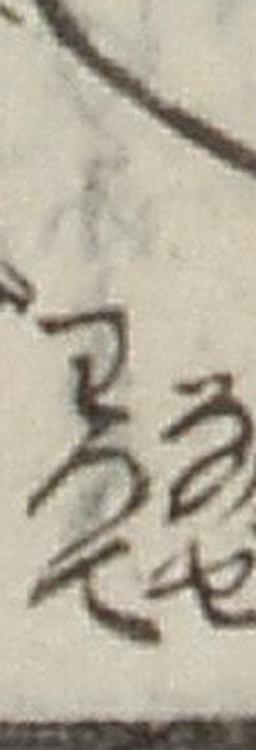わつて
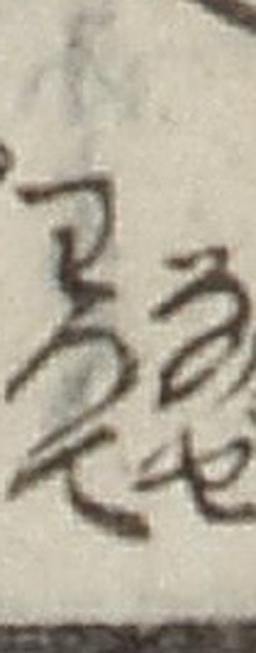わつて
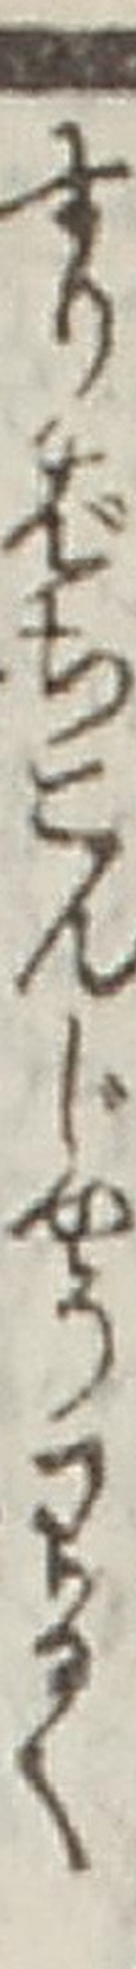すりばちこんじやうわるく
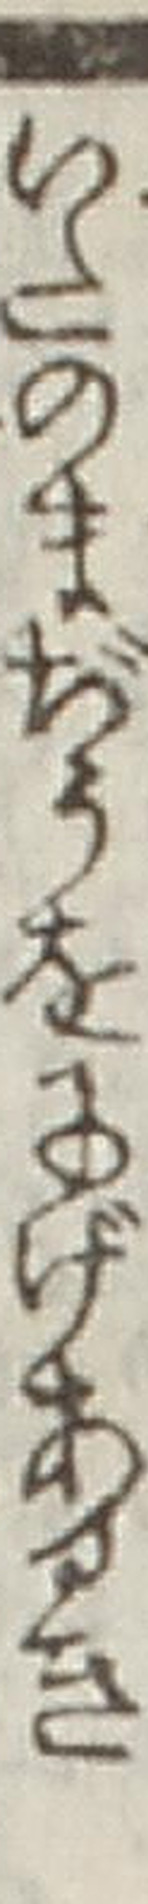いたのまぢうをにげあるき
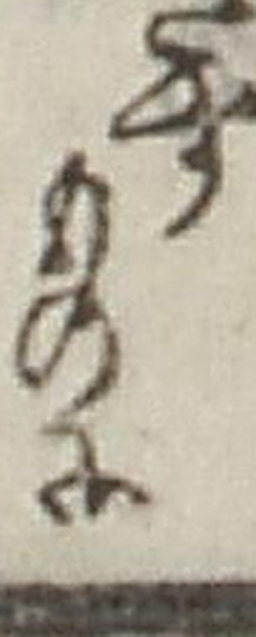ものに
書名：三世相出雲當座帳　上下冊
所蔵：東京大学地震研究所図書室 Earthquake Research Institute Library, The University of Tokyo, JAPAN
